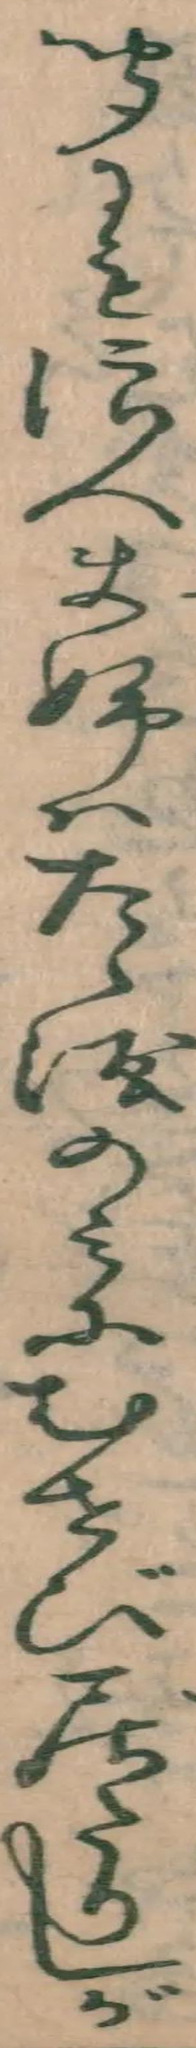聞にも浪人夫婦はたゝ涙のみにむせび居たりしが
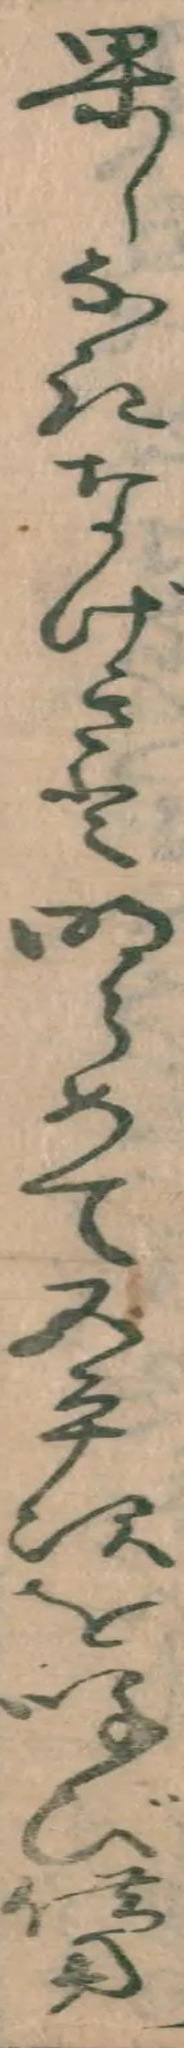果しなきなげきと明らめて五平次を呼び借用
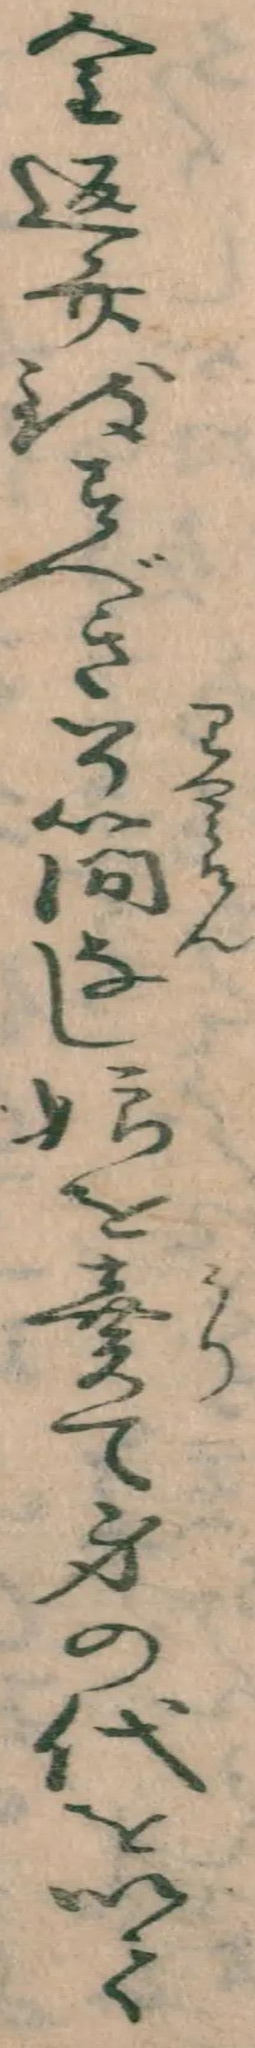金返弁致すべき了簡なし娘を売て身の代を以て
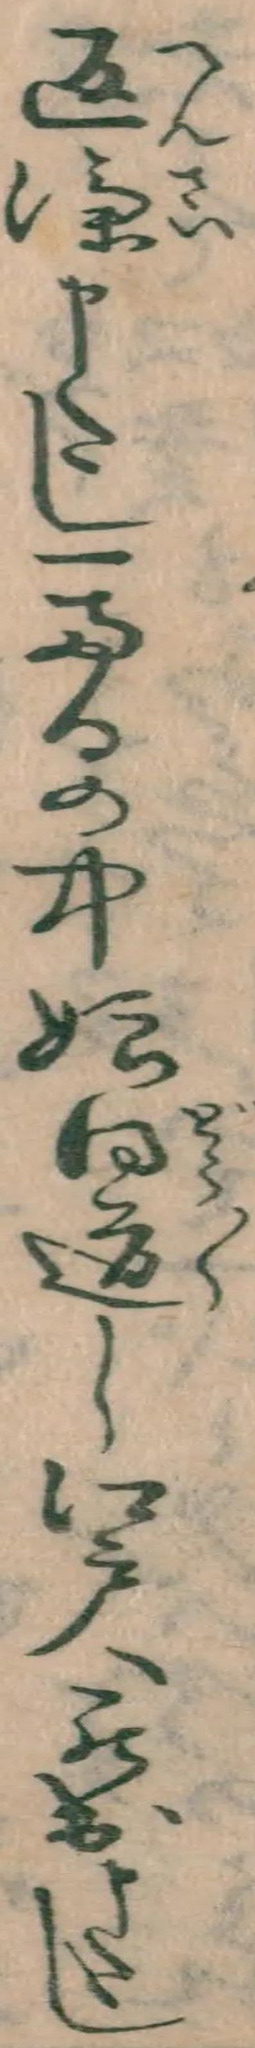返済申たし一両日の中娘同道し江戸へ罷出申たし
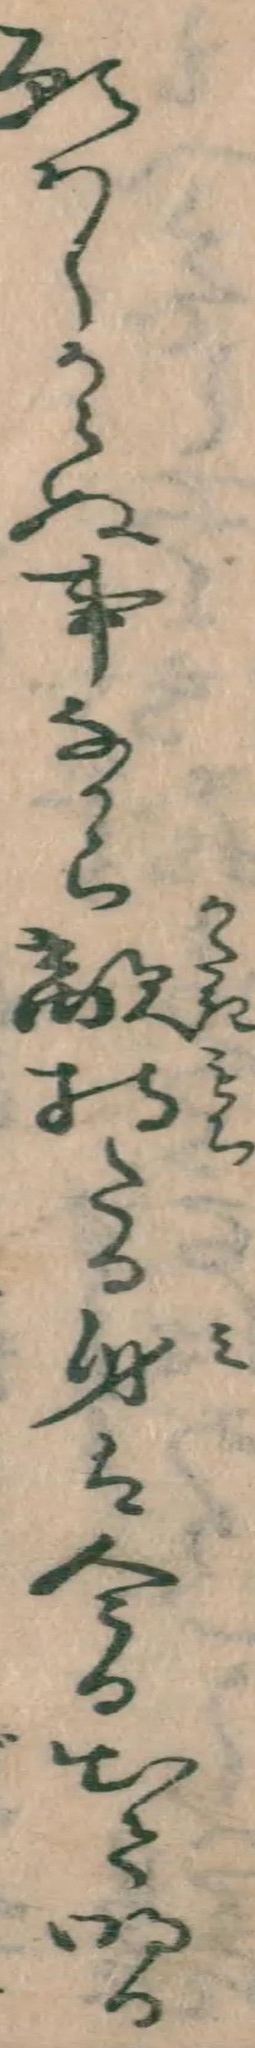願はしからぬ事なから敵持たる身は今日出て明日
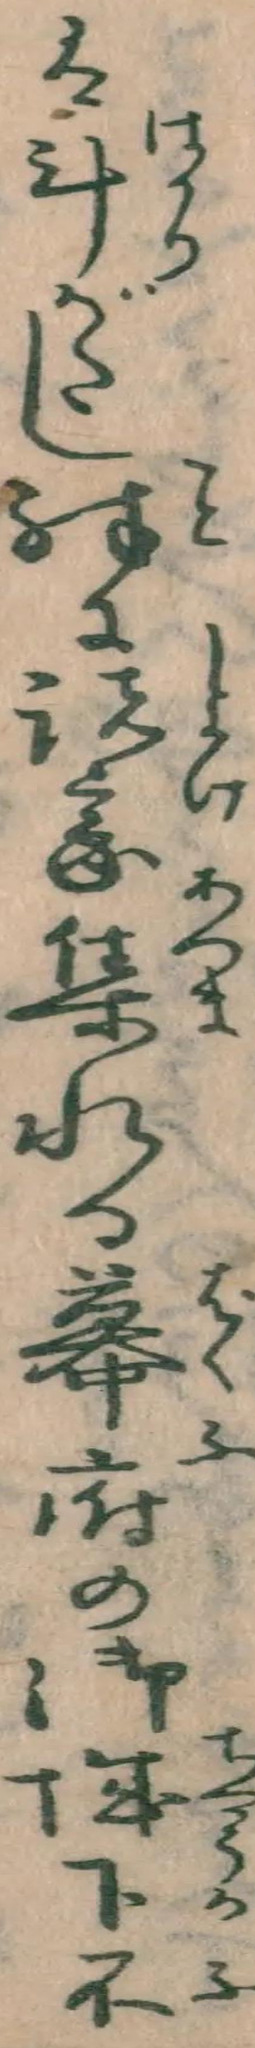は斗がたし殊に諸家集れる幕府の御城下不
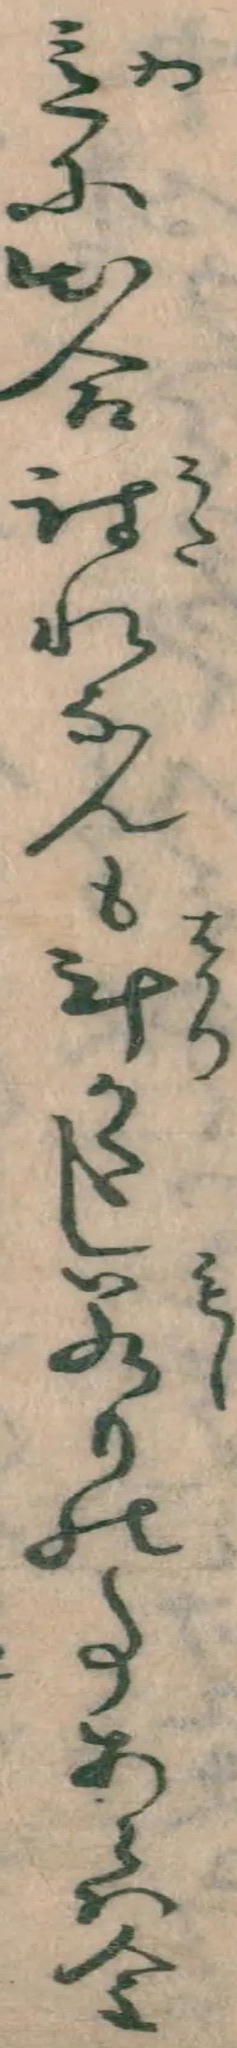意に出合討れなんも斗かたし若もの事あらは金
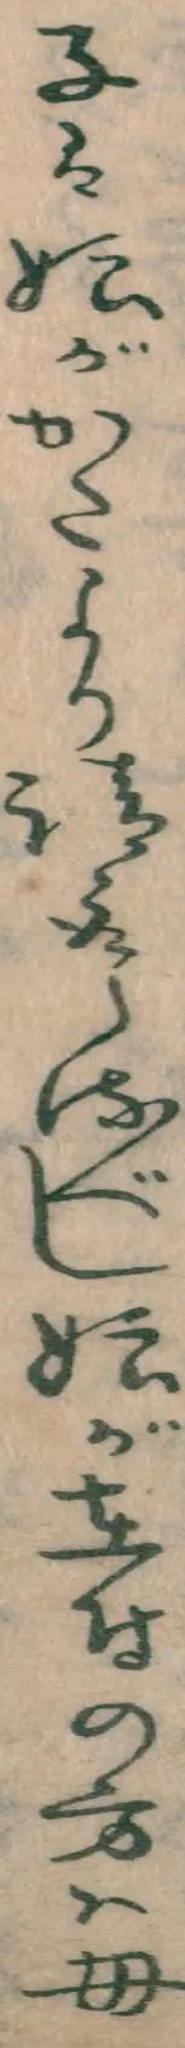子は娘がかたより請取らるべし娘が在付の方は母
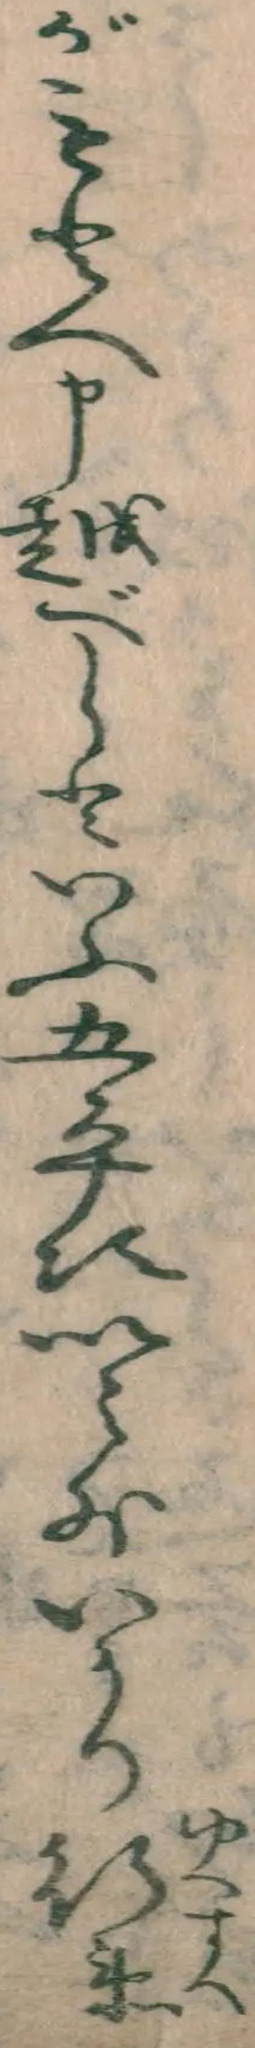がもとへ申越べしといふ五平次以之外いかり行末
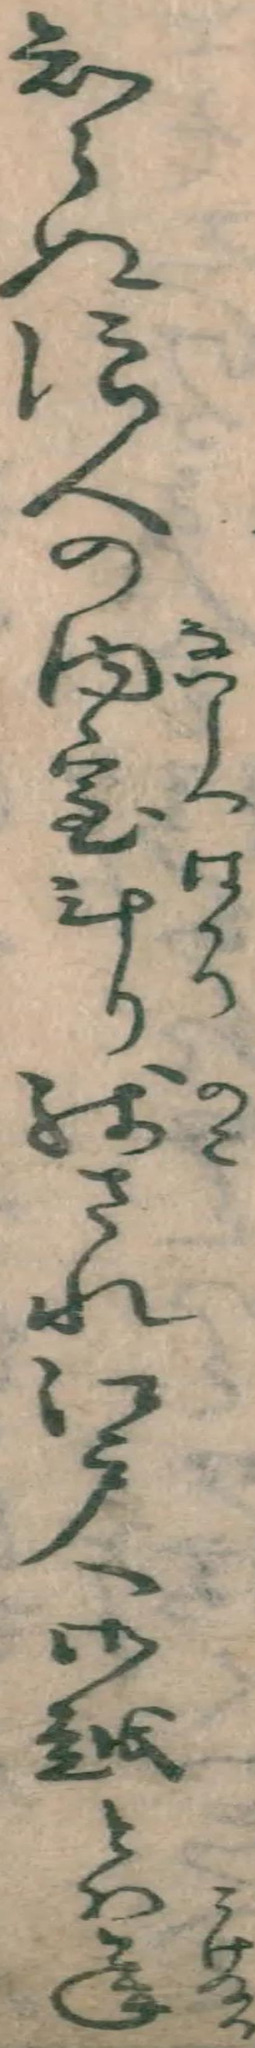知らぬ浪人の内室斗り残され江戸へ御越しとは承
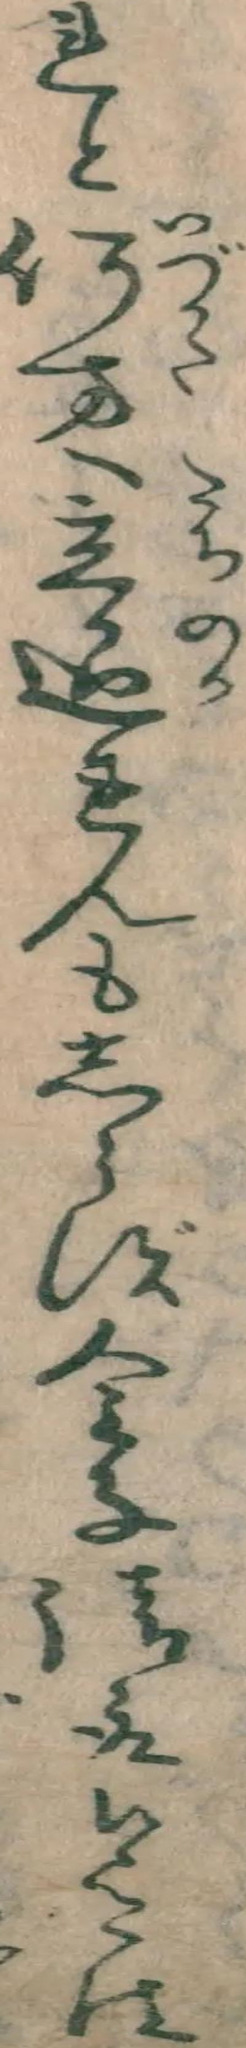れと何方へ立退れんもしらず金子請取候迄は

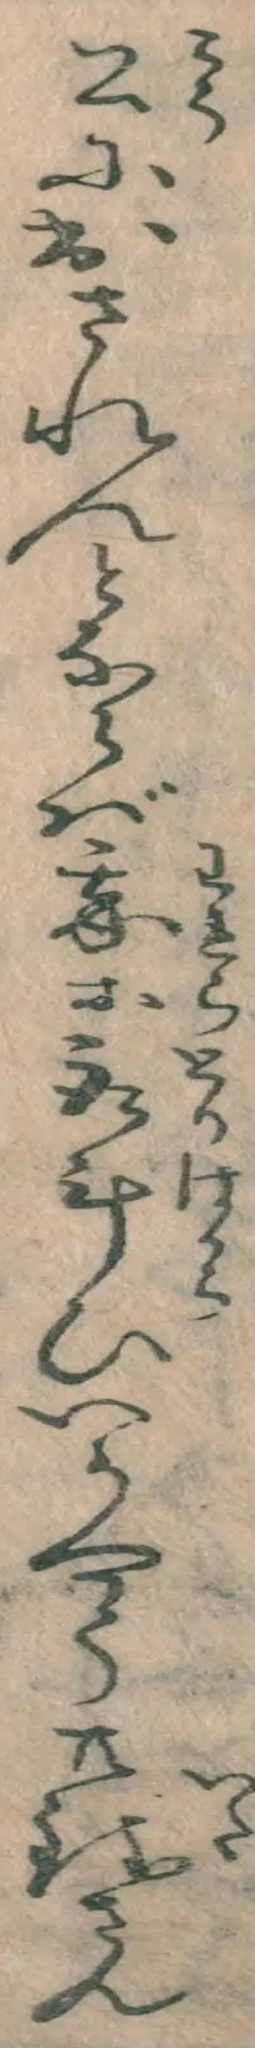公に出されんとならば我等取斗いかやう共致さん
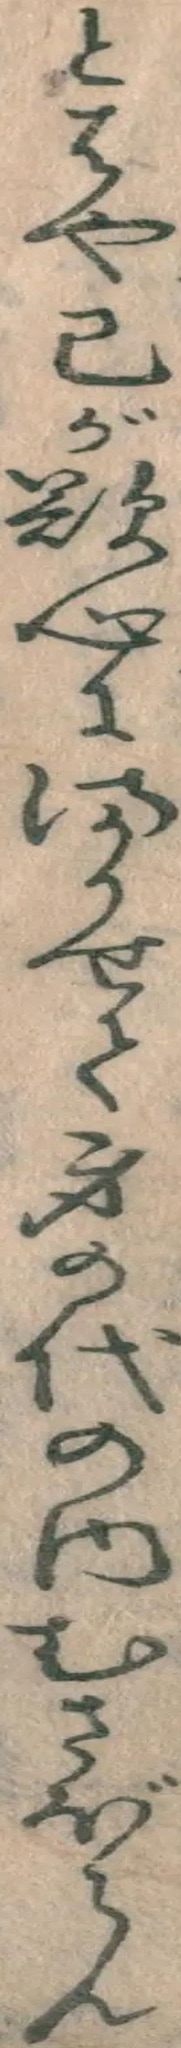とはや己が欲心にまかせて身の代の内むさぼらん
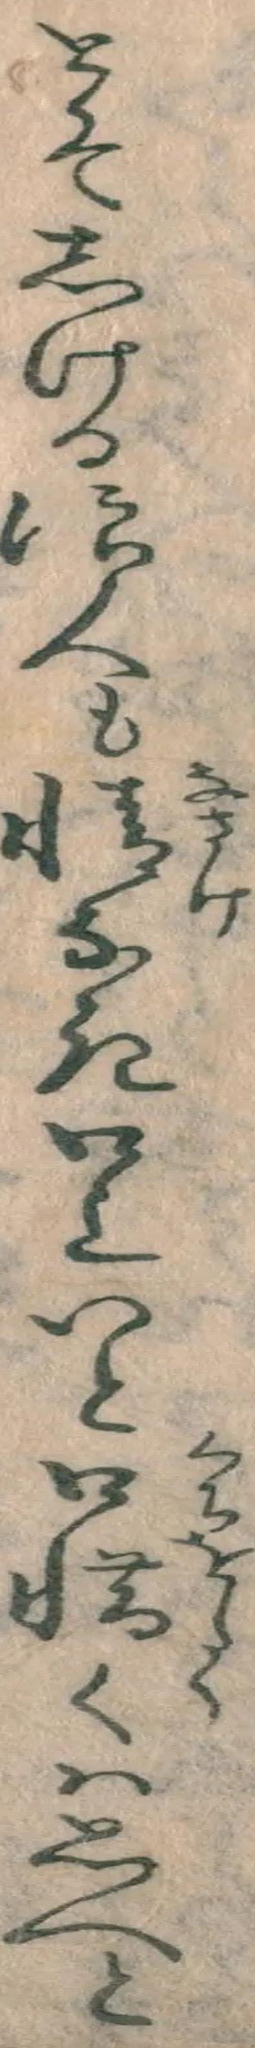とてしける浪人も情なき口上いと口惜くは思へと
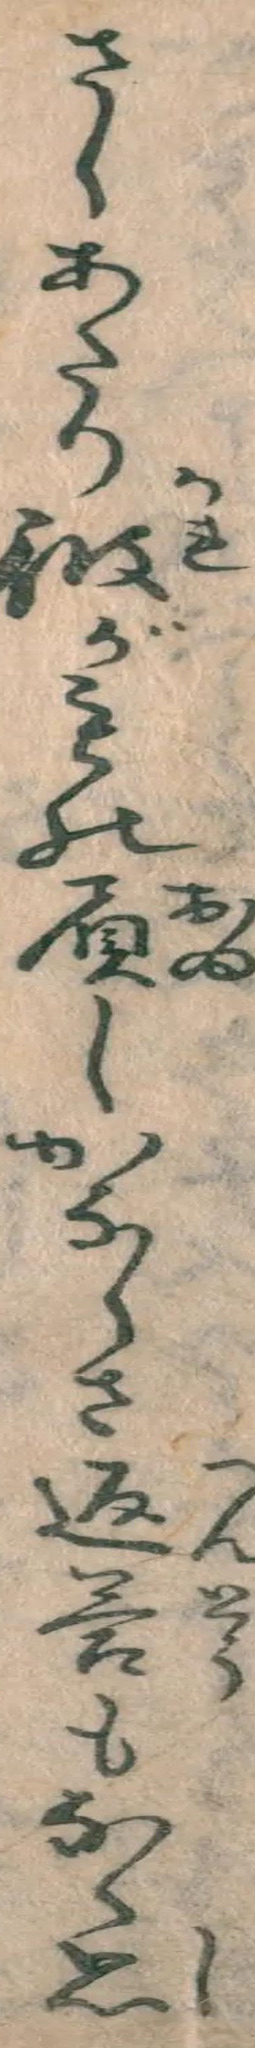さしあたり彼がもの負しかなしさ返答もなく思
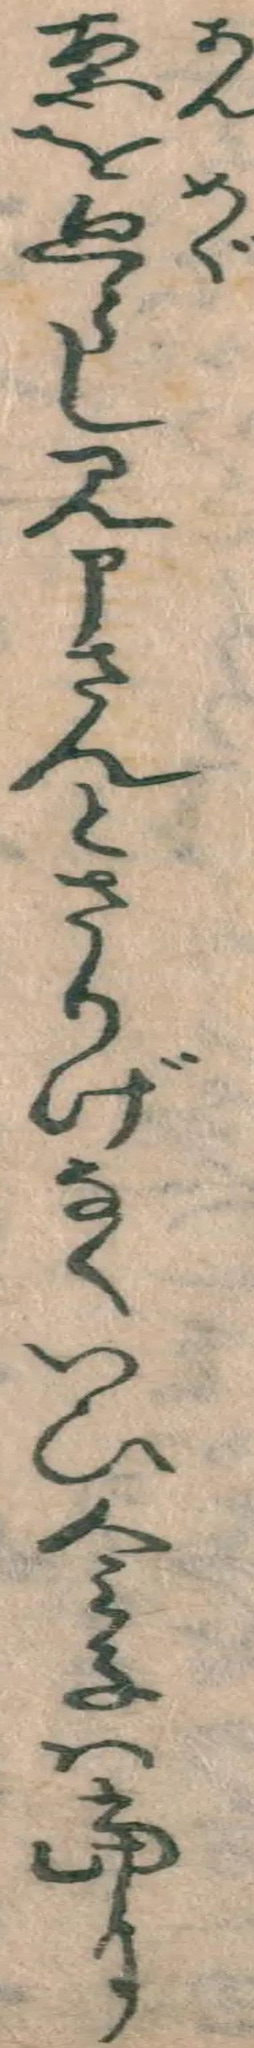案を廻らし見申さんとさりげなくいひ金子は当月
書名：怪談御伽童 5巻. [2]
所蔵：国立国会図書館 National Diet Library, JAPAN
